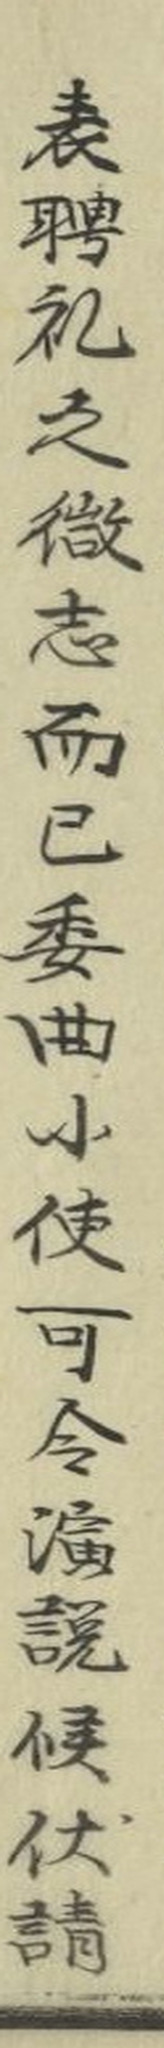表聘礼之徴志而己委曲小使可令演説候伏請
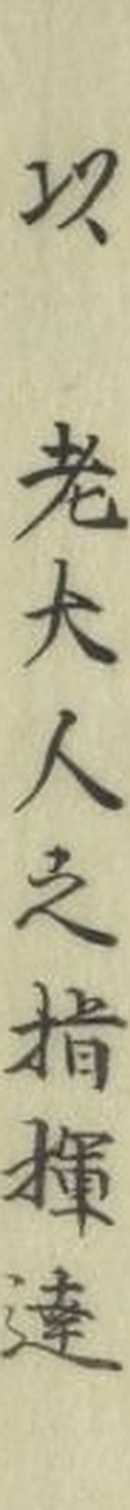以老大人之指揮達
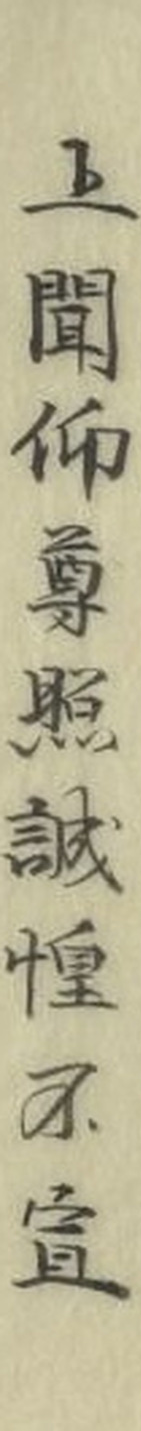上聞仰尊照誠惶不宣
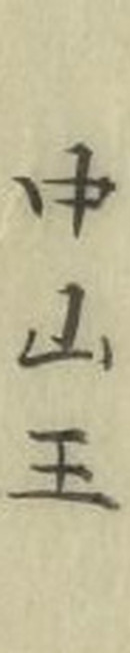中山王
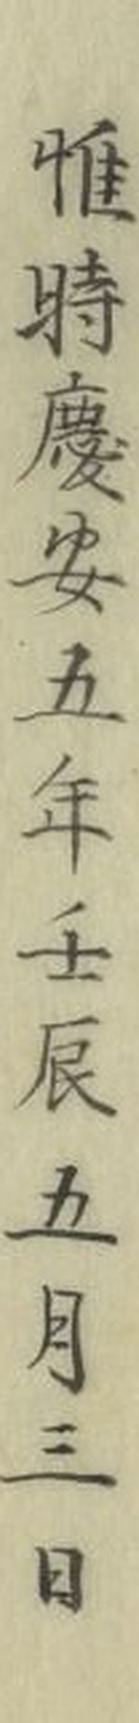惟時慶安五年壬辰五月三日尚質
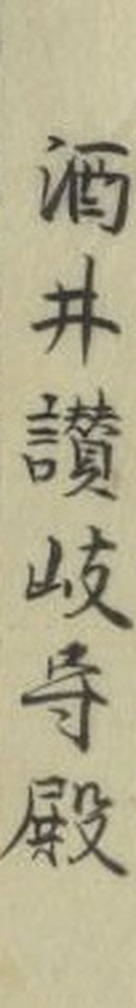酒井讃岐守殿

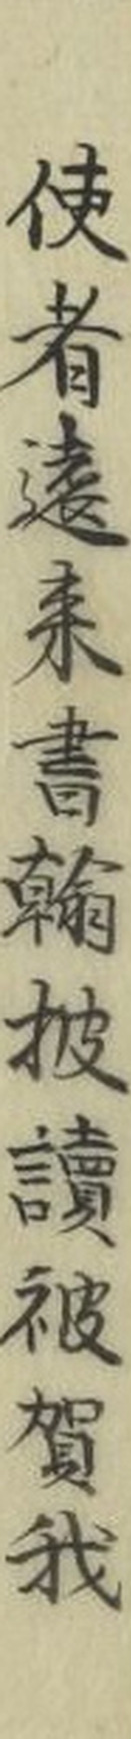使者遠来書翰披読被賀我
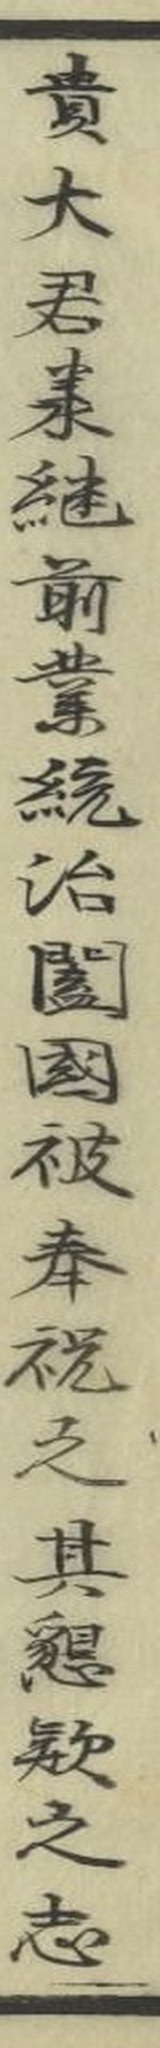貴大君承継前業統治闔国被奉祝之懇款之志
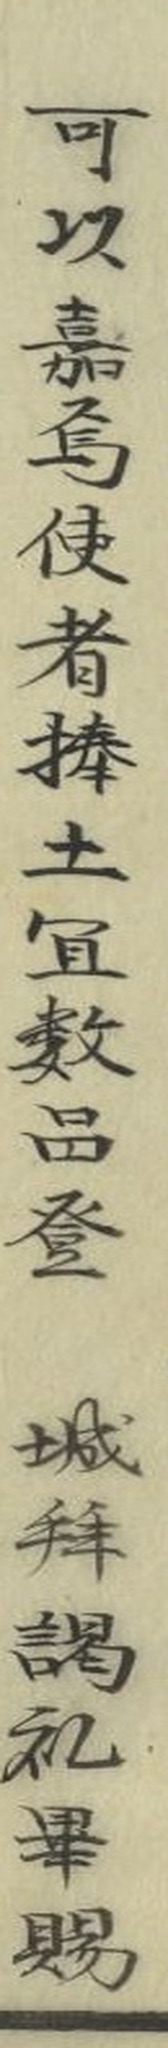可以嘉焉使者捧土冝数品登城拝謁礼畢賜
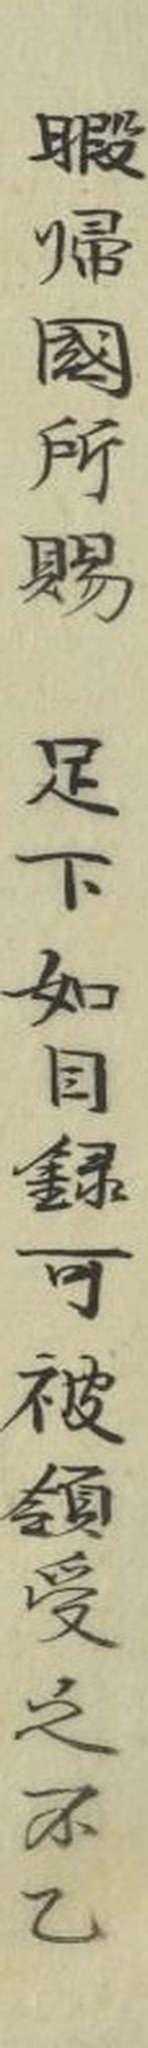暇帰国所賜足下如目録可被領受之不乙
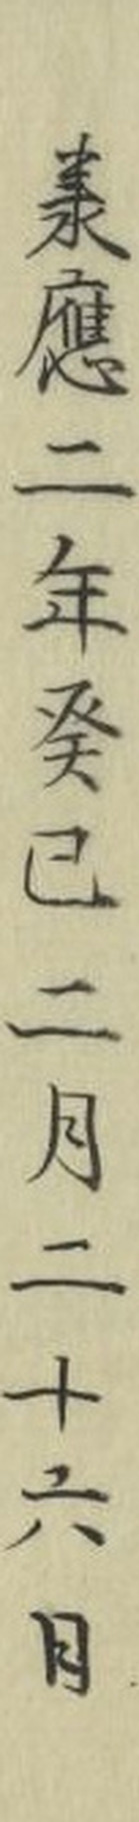承応二年辛己二月二十六日
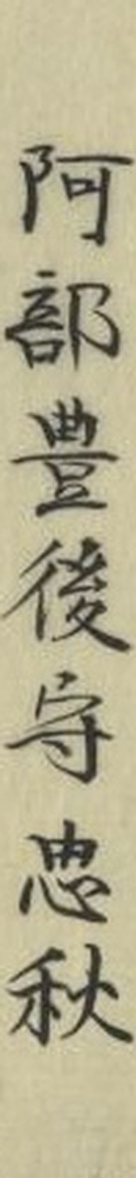阿部豊後守忠秋
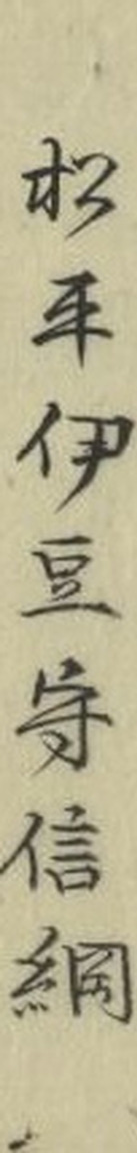松平伊豆守信綱
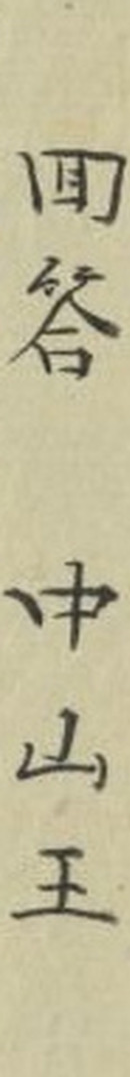回答中山王
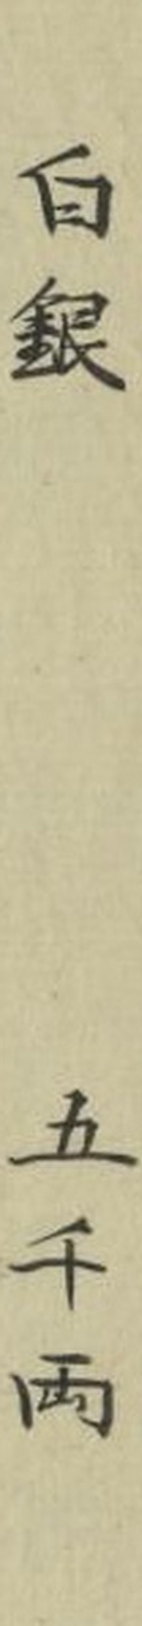白銀五千両
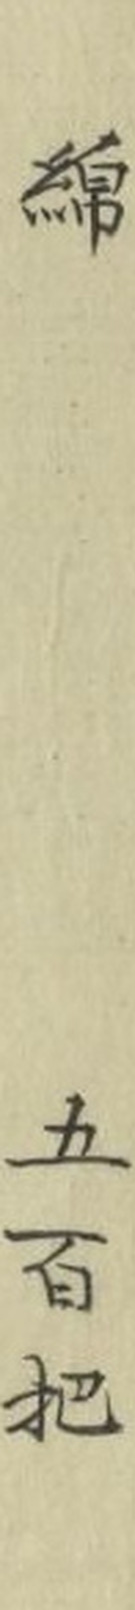綿五百把
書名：琉球往来（上）
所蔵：University of the Ryukyus Library
